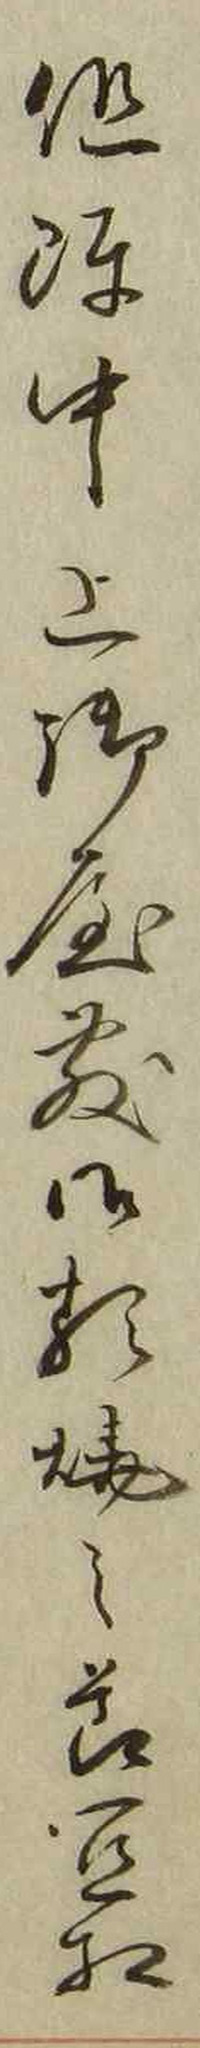但陣中上御屋敷御類焼之節宜相
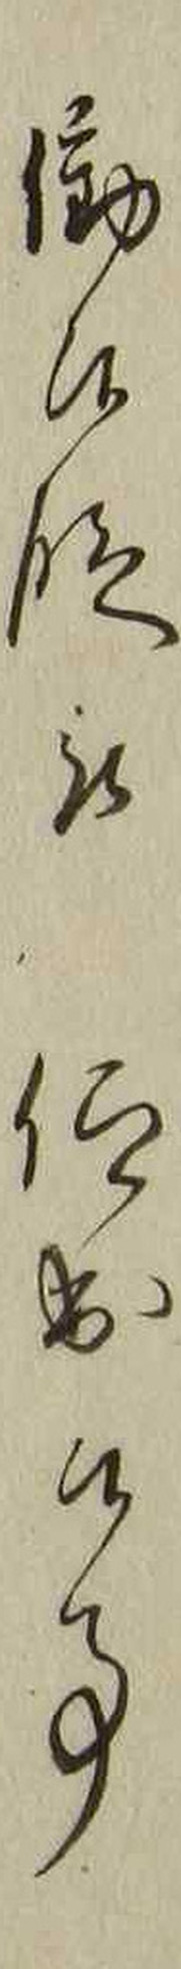働候段被仰出候事
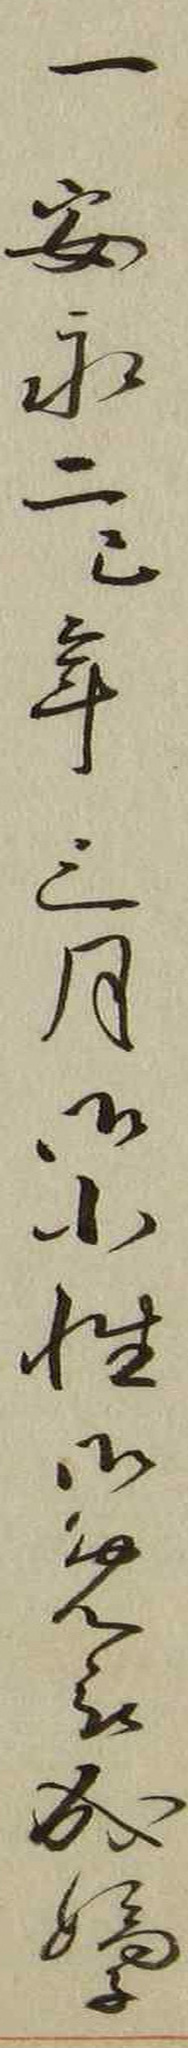一安永二巳年三月御小性御免被成嫡子
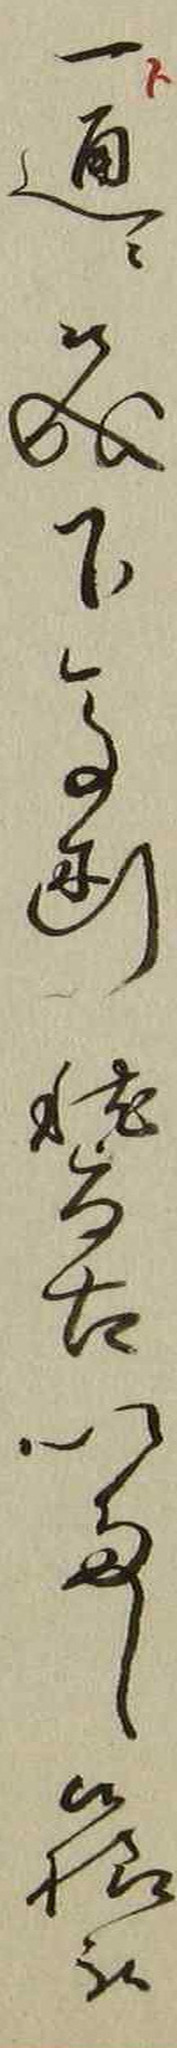一通ニ被成下馬術稽古いたし候様被
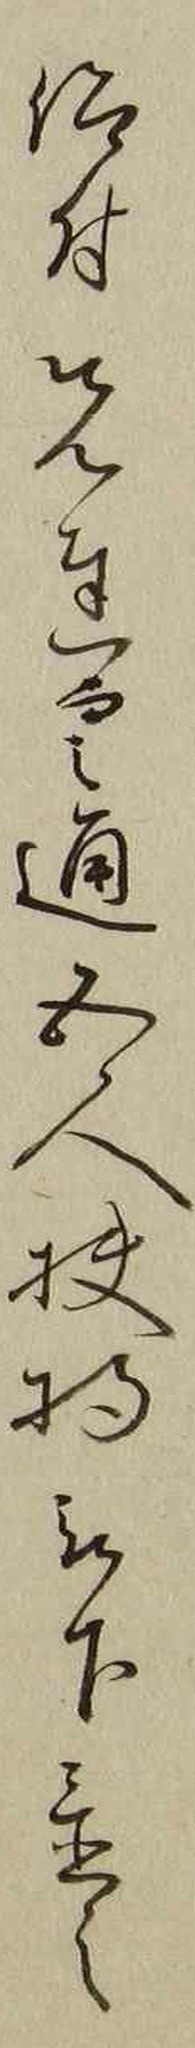仰付先達而之通五人扶持被下置之
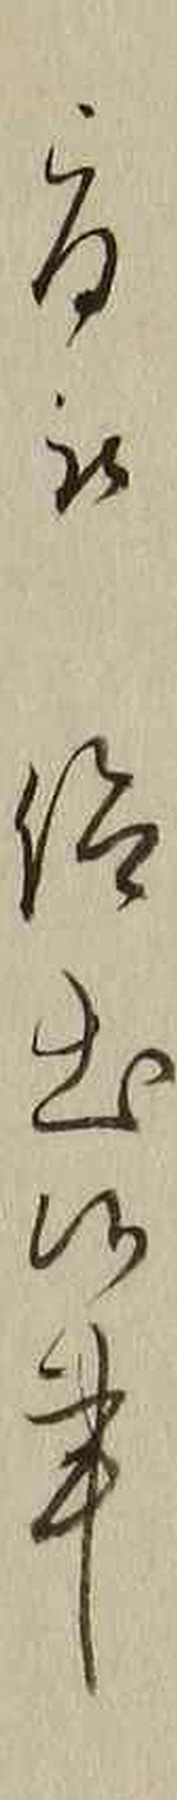旨被仰出候事
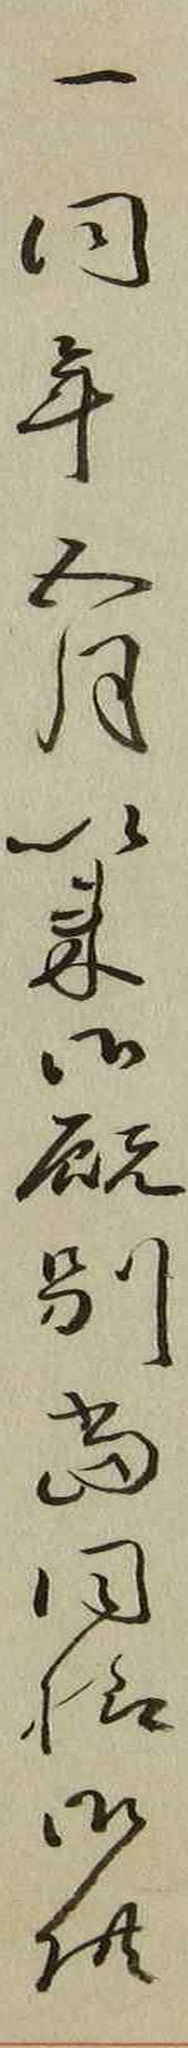一同年五月以来御厩別当同様御供
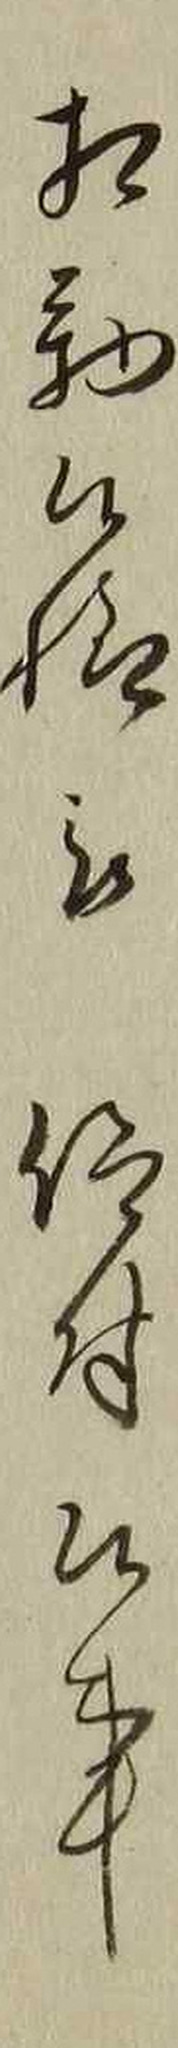相勤候様被仰付候事
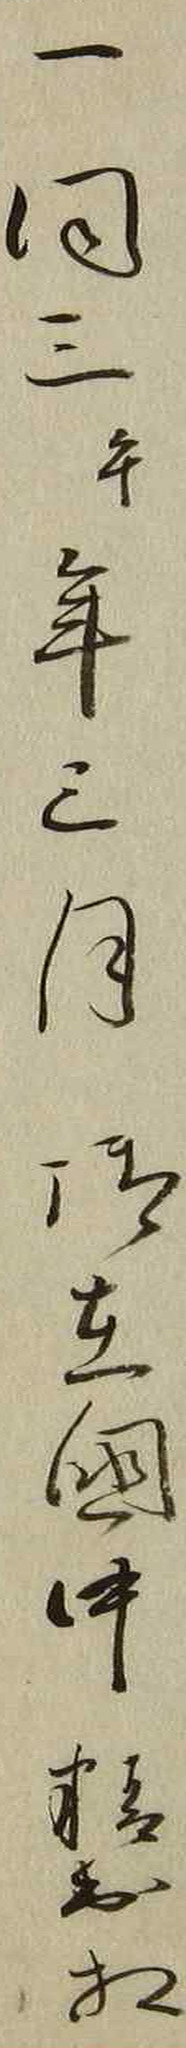一同三午年三月御在国中精出相
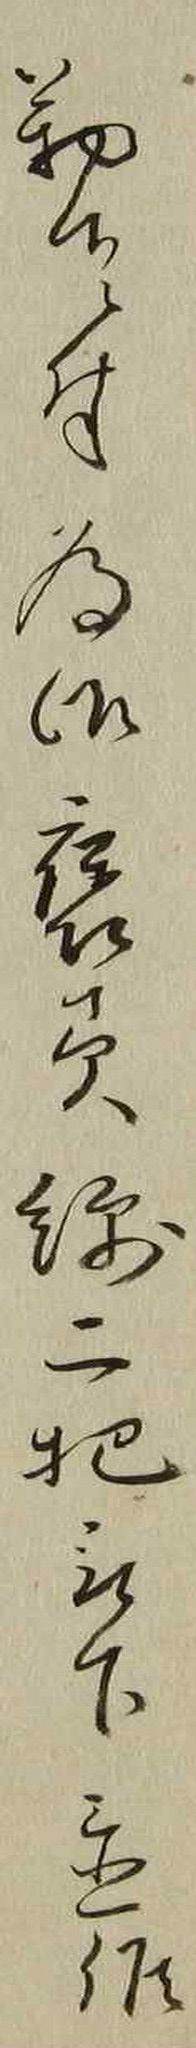勤候ニ付為御褒美綿二把被下置候
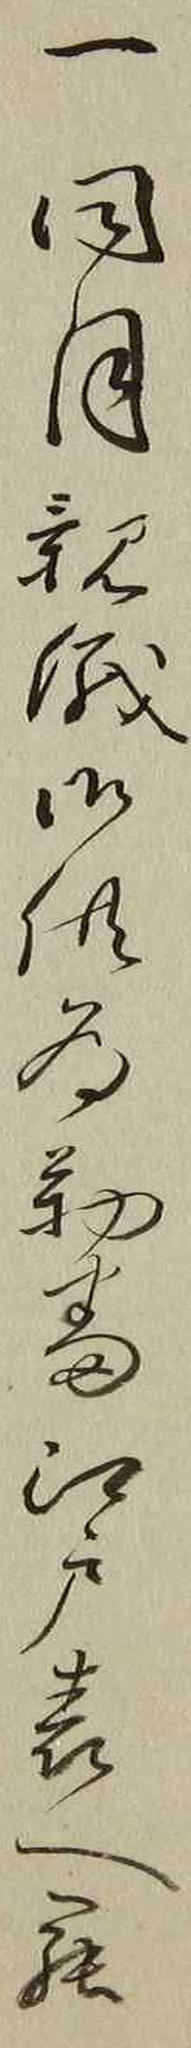一同月親儀御供為勤番江戸表へ罷
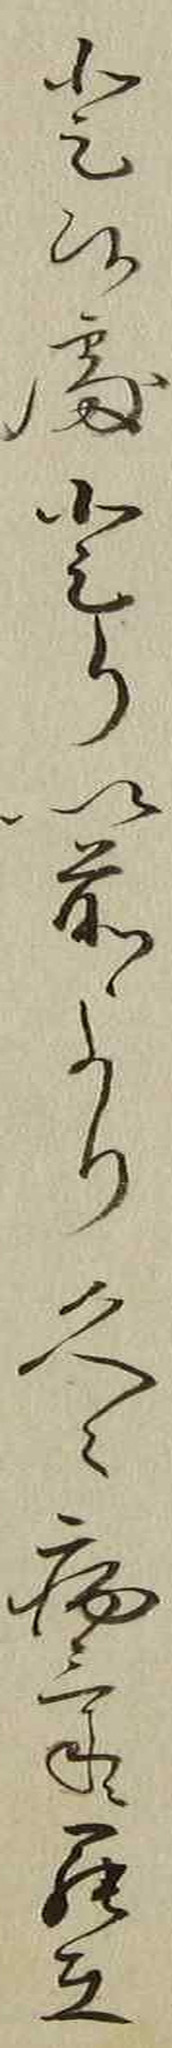登候處登り以前より久々病気ニ罷在
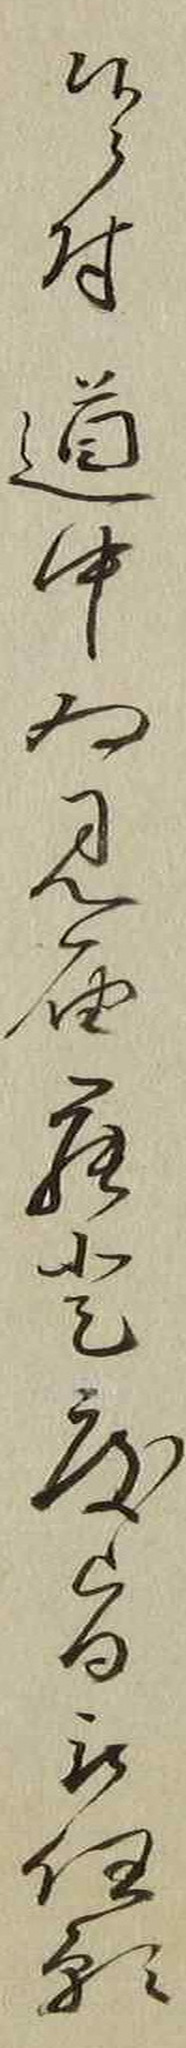候ニ付道中為見届罷登度旨被任願
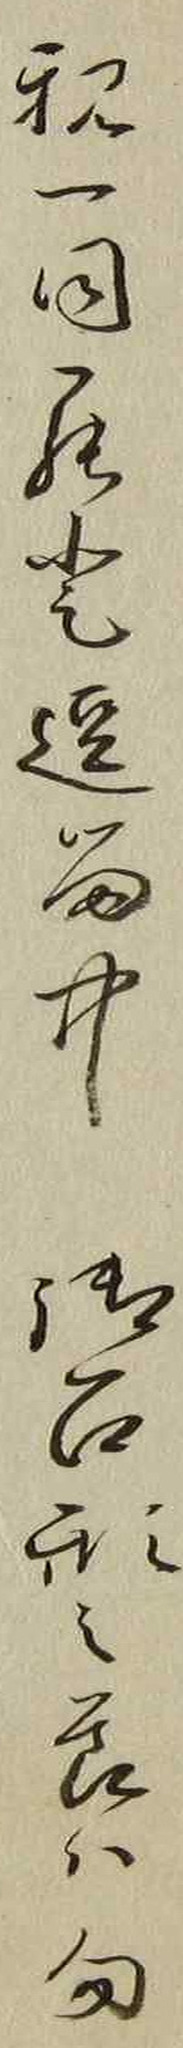親一同罷登逗留中御召形之節ハ勿
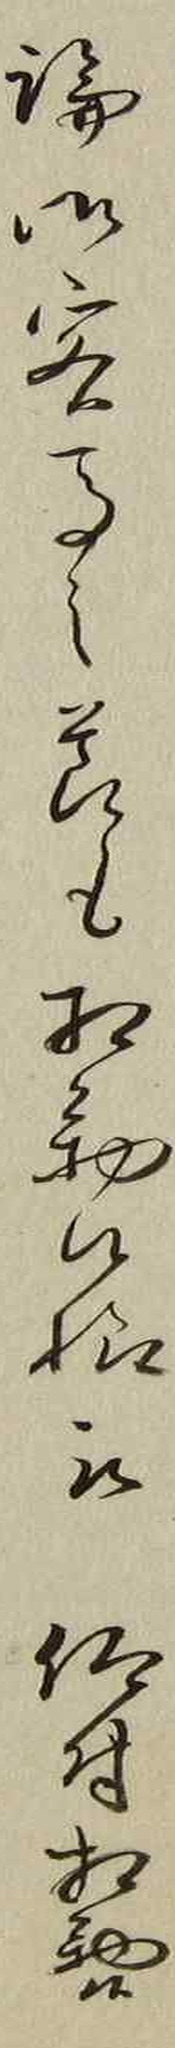論御客馬之節も相勤候様被仰付相勤候
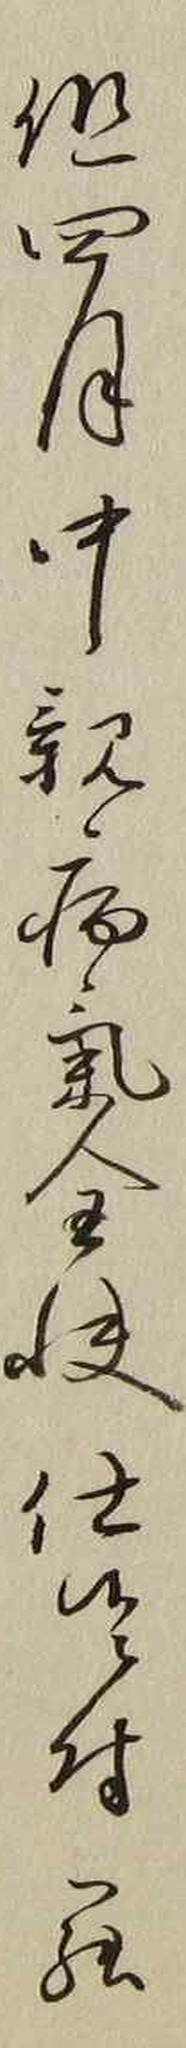但四月中親病気全快仕候ニ付罷
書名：諸士系譜　巻之3　い之部3
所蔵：会津若松市立会津図書館
